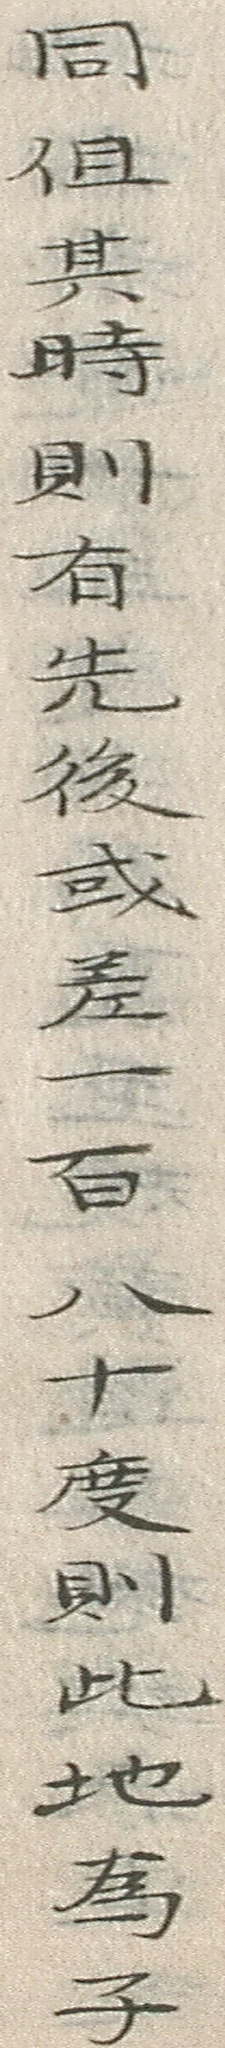同但其時則有先後或差一百八十度則此地為子
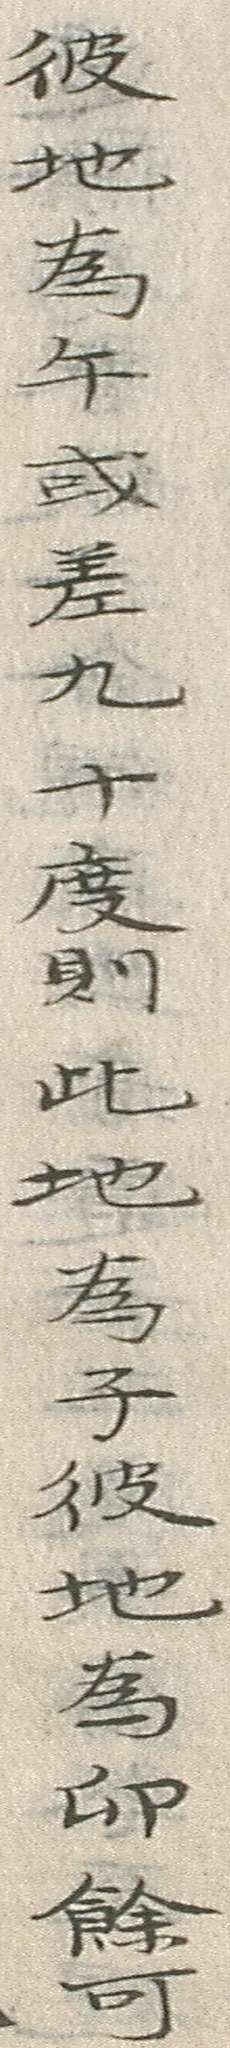彼地為午或差九十度則此地為子彼地為卯余可
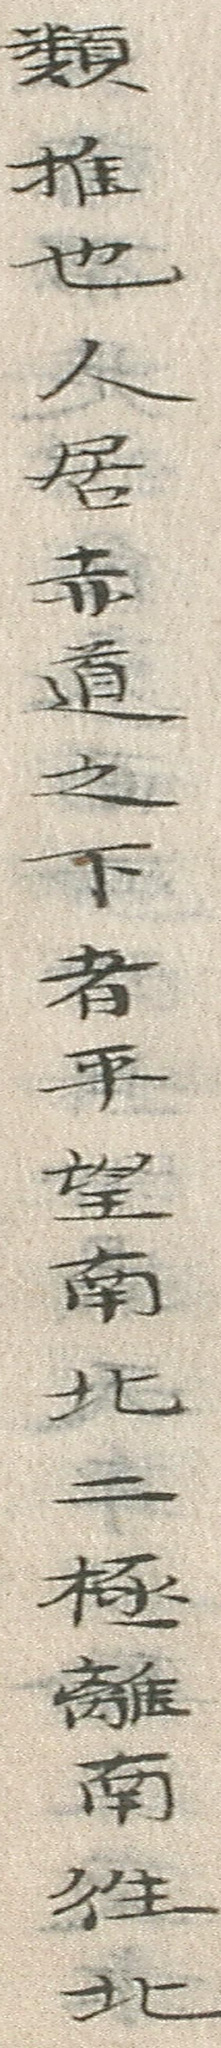類推也人居赤道之下者平望南北二極離南往北
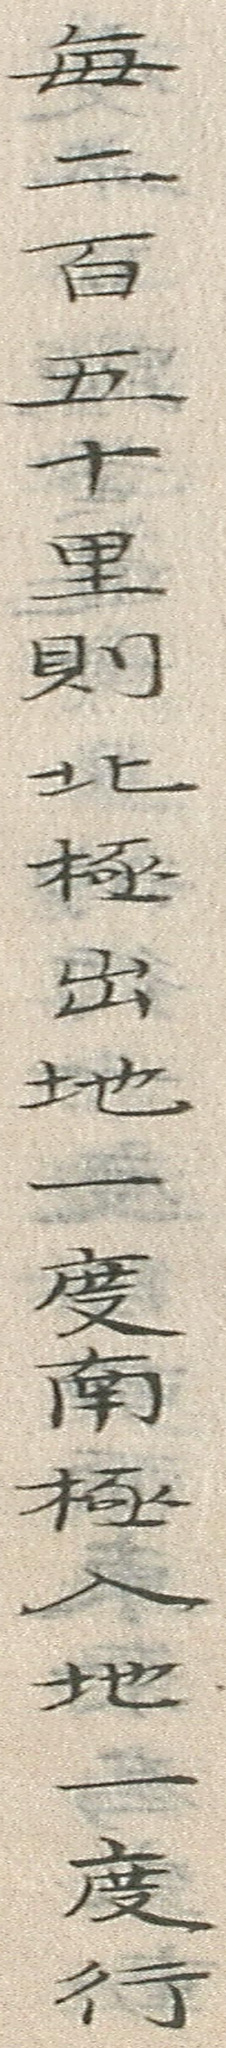毎二百五十里則北極出地一度南極入地一度行
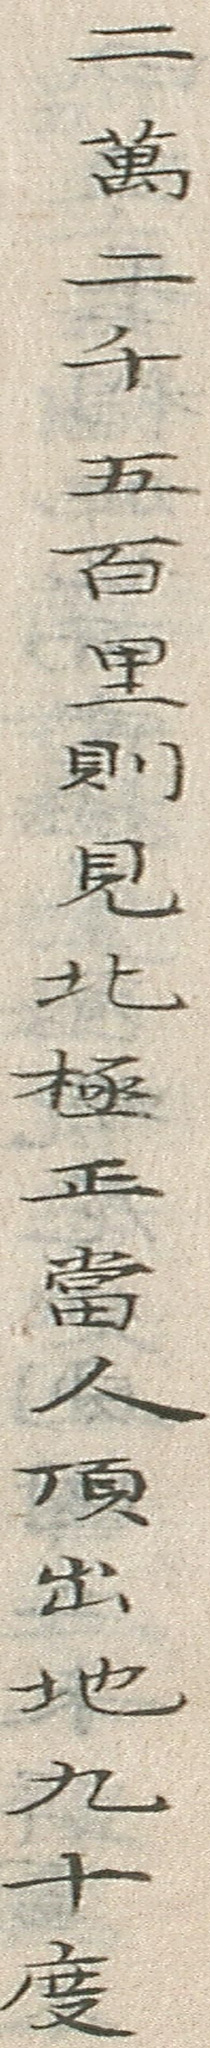二万二千五百里則見北極正当人頂出地九十度
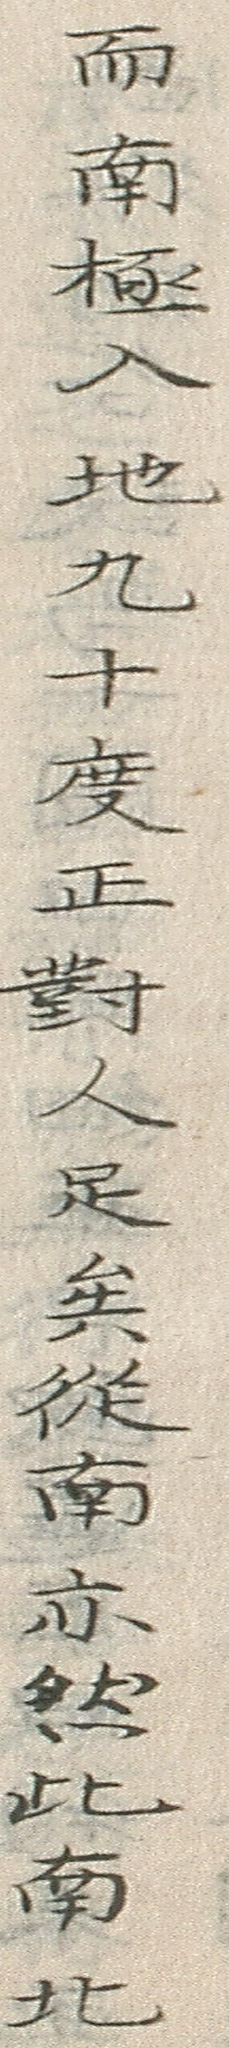而南極入地九十度正対人足矣従南亦然此南北
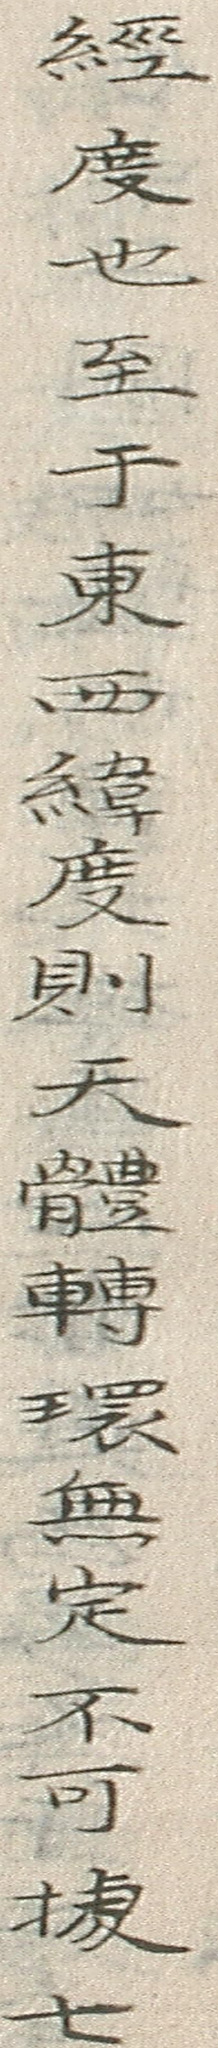経度也至于東西緯度則天体転環無定不可拠七
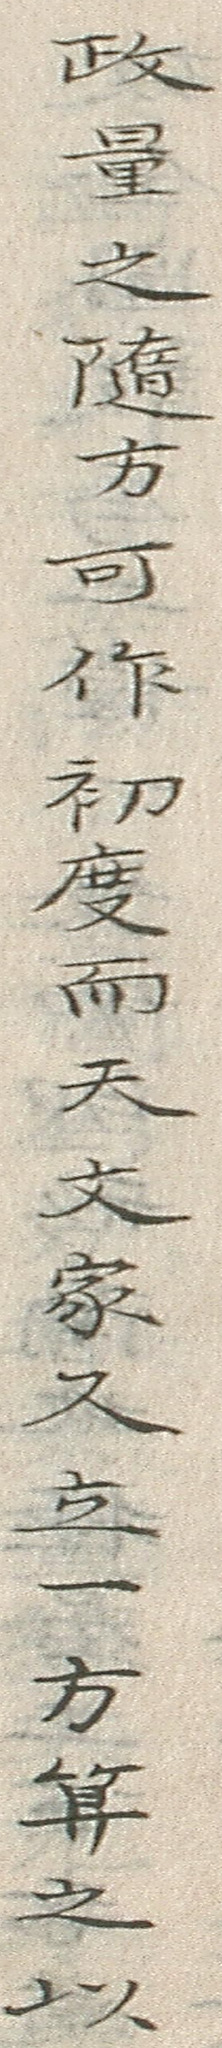政量之随方可作初度而天文象又立一方算之以
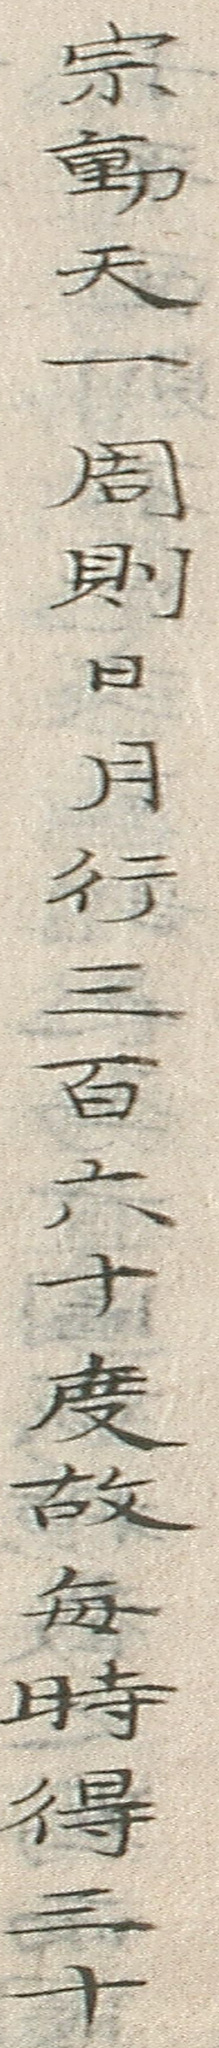宗動天一周則日月行三百六十度故毎時得三十
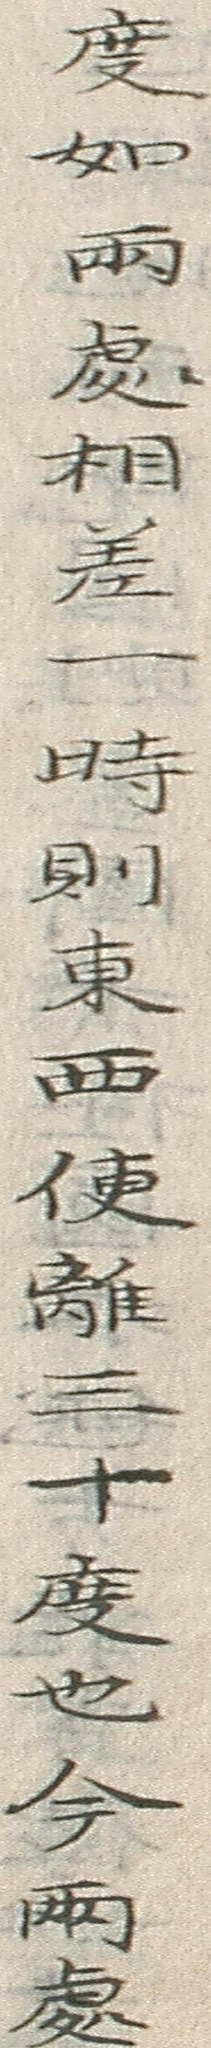度如両処相差一時則東西便離三十度也今両処
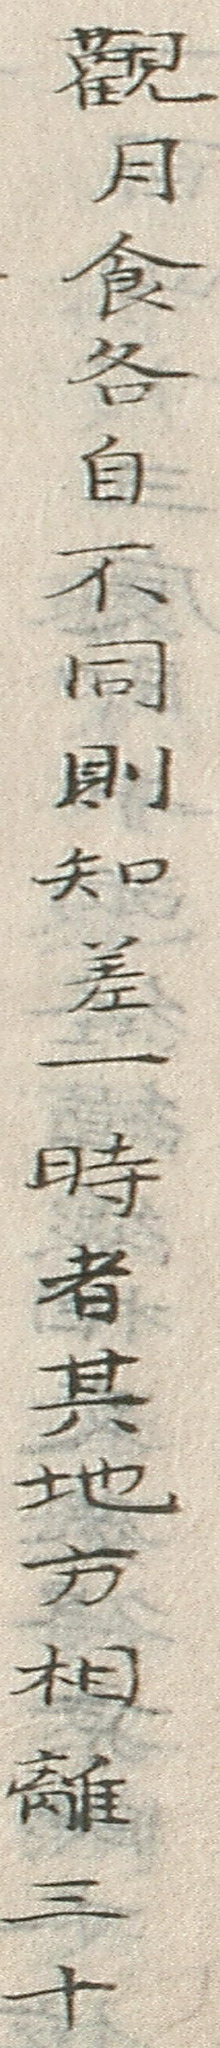観月食各自不同則知差一時者其地方相離三十
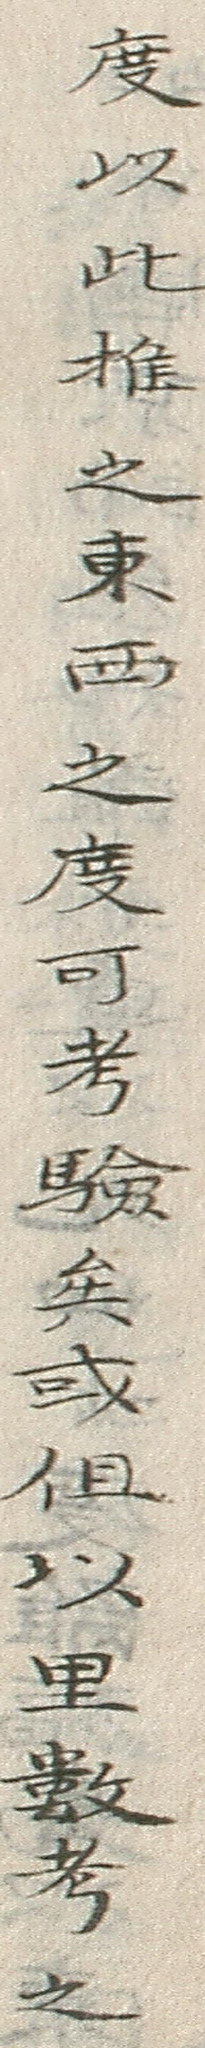度以此推之東西之度可考験矣或但以里数考之
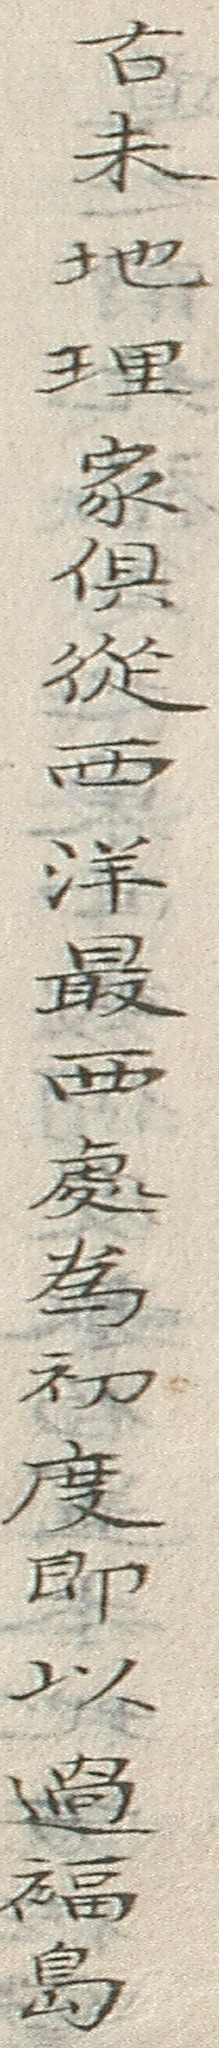古未地理家俱従西洋最西処為初度即以過福島
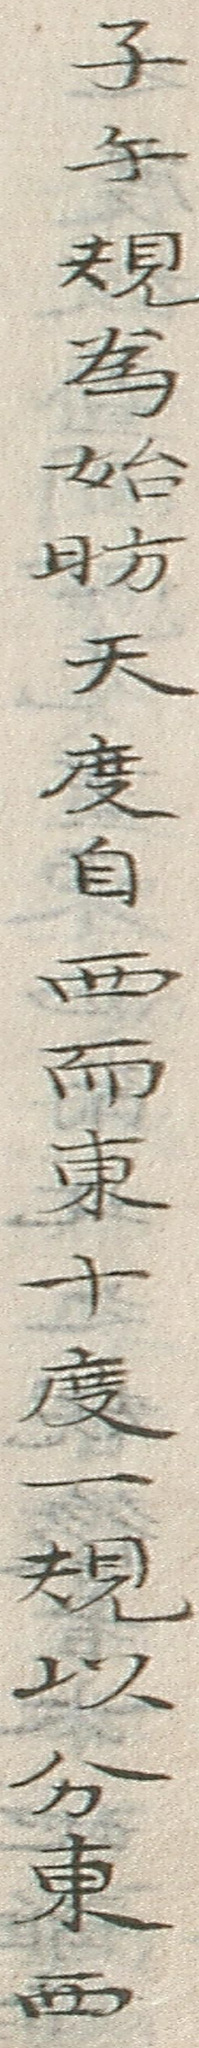子午規為始昉天度自西而東十度一規以分東西

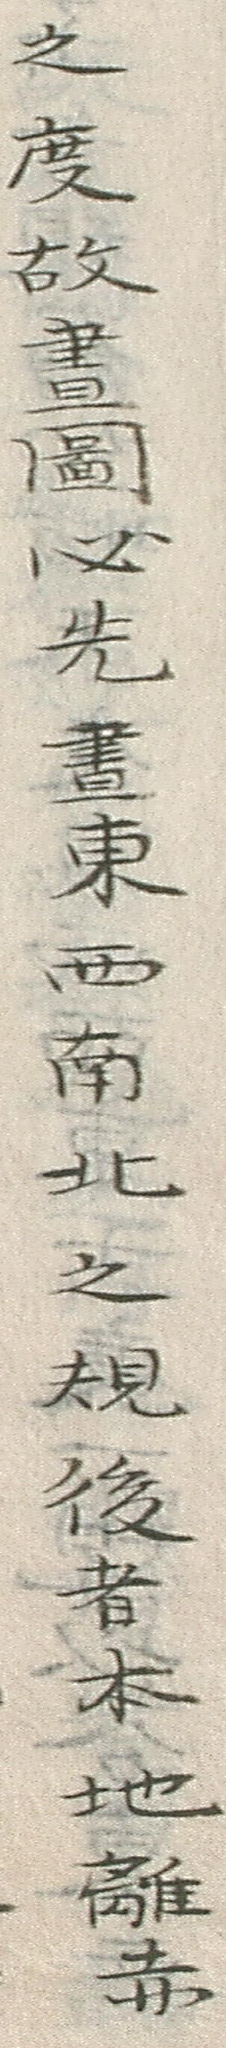之度故画図必先画東西南北之規後者本地離赤
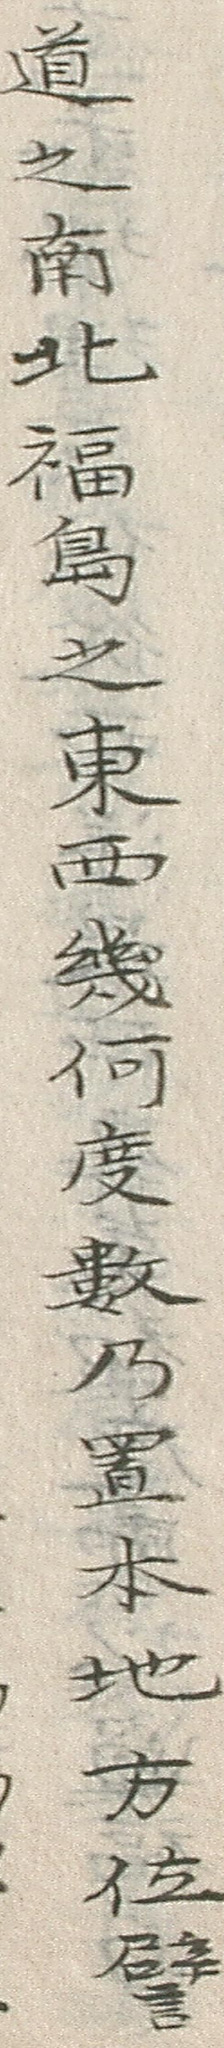道之南北福島之東西幾何度数乃置本地方位譬
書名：天學略名目羽翼　全
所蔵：東京大学地震研究所図書室 Earthquake Research Institute Library, The University of Tokyo, JAPAN
